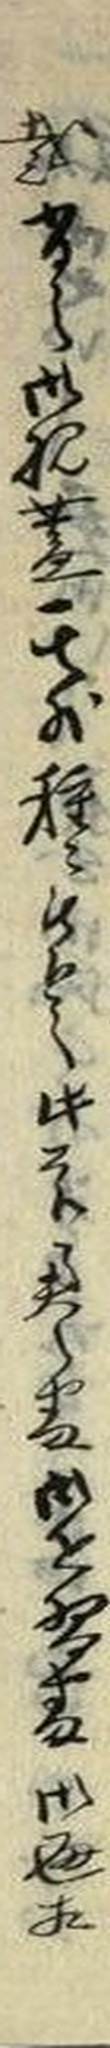戴有之御硯蓋其外種々被下之此節奥之番御近習番御通相

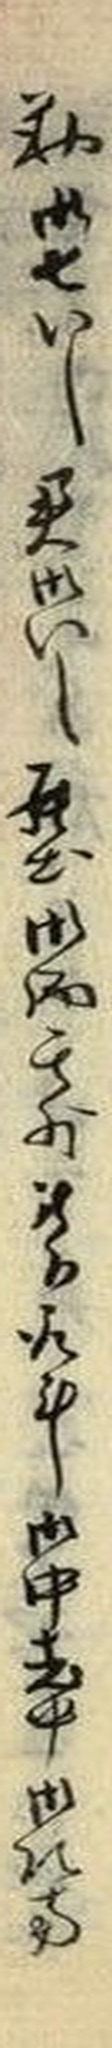勤御匙いし奥御いし罷出御酒其外被下取計御中老中御次南
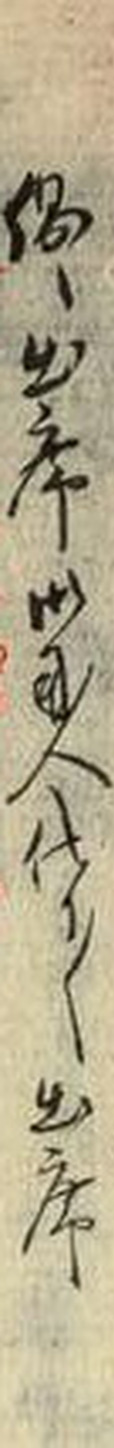側へ出席御用人代り〳〵出席
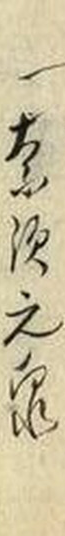奈須元泉
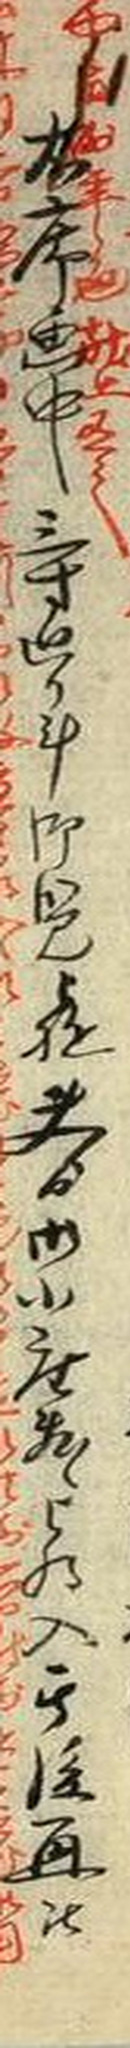右席画中三寸廻り斗御覧被遊夫ゟ御小座敷へ被為入其後再被
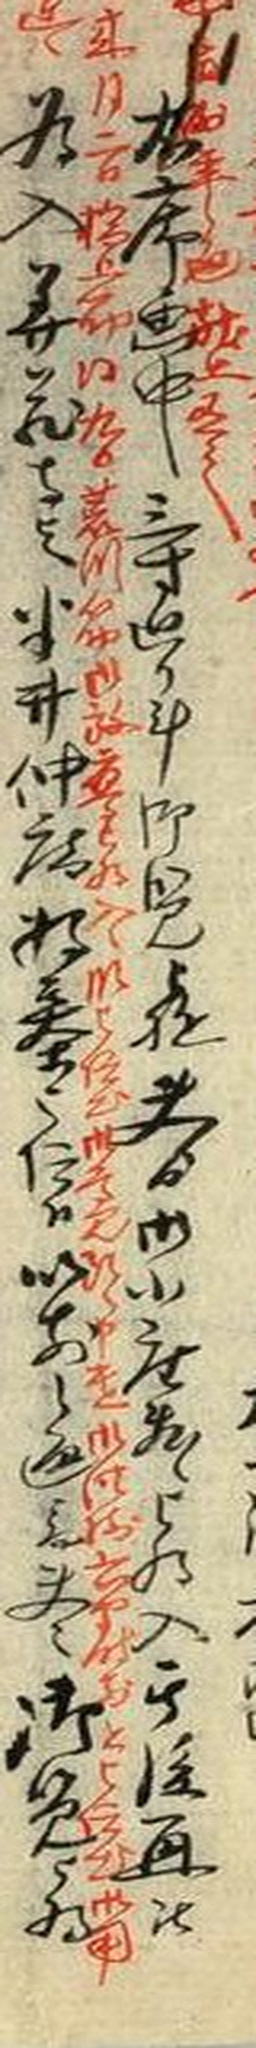為入華蔵寺与半井仲庵被仰付以前之通ニ而夫々御覧被為
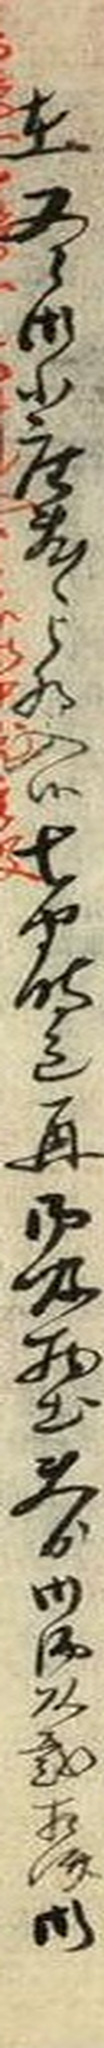在又々御小座敷へ被為入候七半時過再御吸物出夫ゟ御酒頂戴相済御
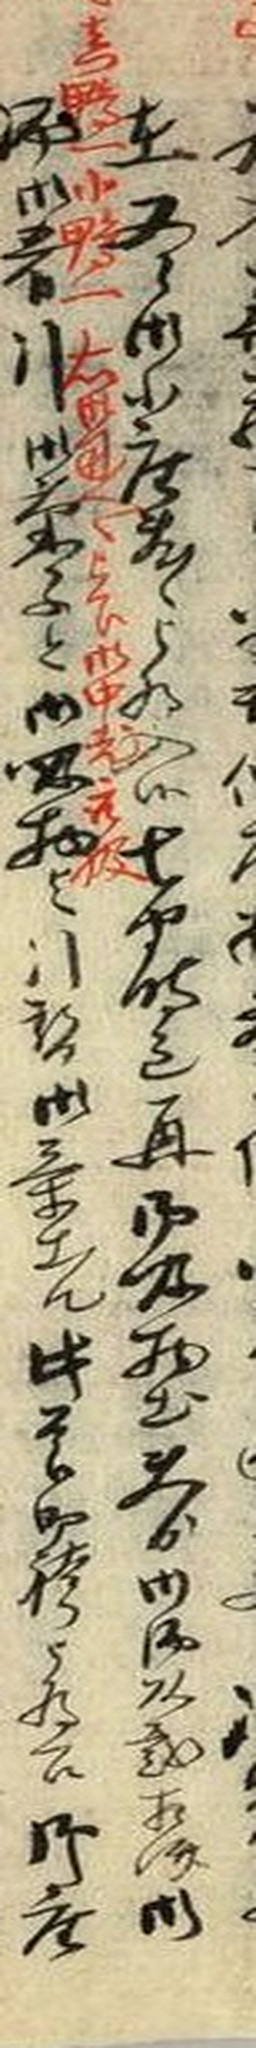酒御肴引御菓子と御吸物与引替御茶出ル此節御袴被為召御座
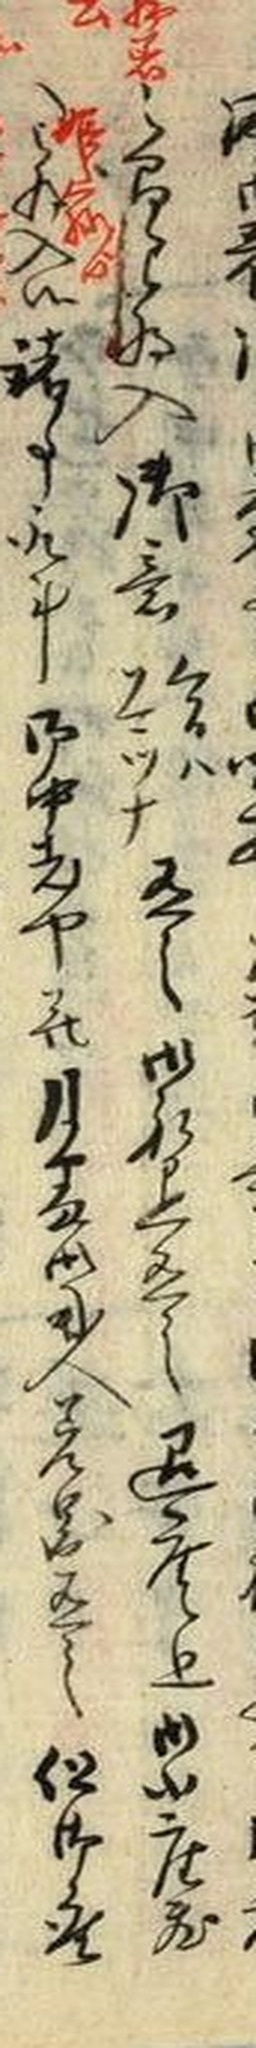へ被為入候諸事取計御中老中幷月番御用人差図有之但御座
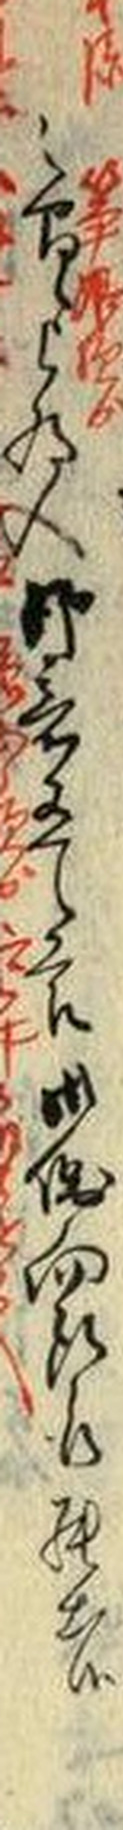之間へ被為入御意有之節御側向頭取罷出候
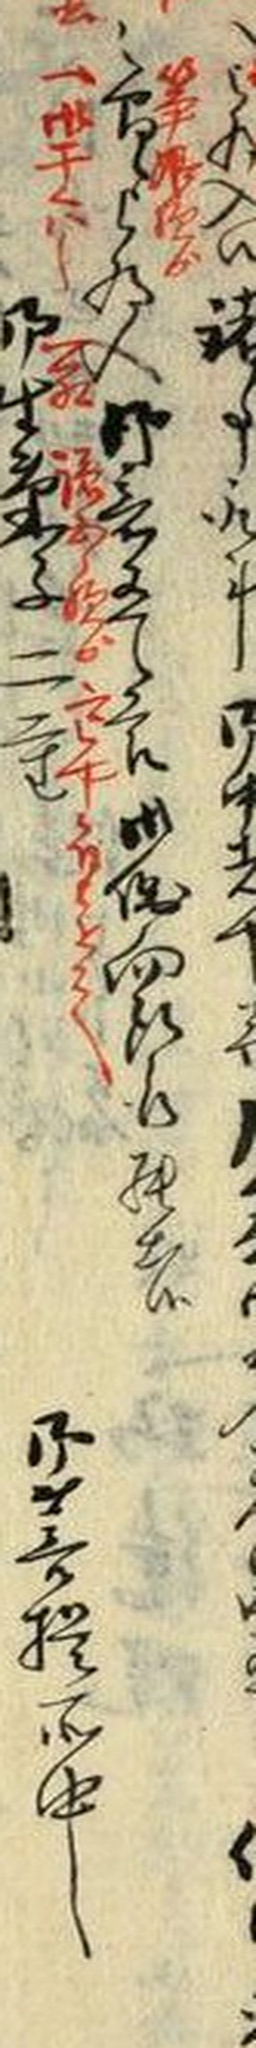御生菓子二重御菩提所中
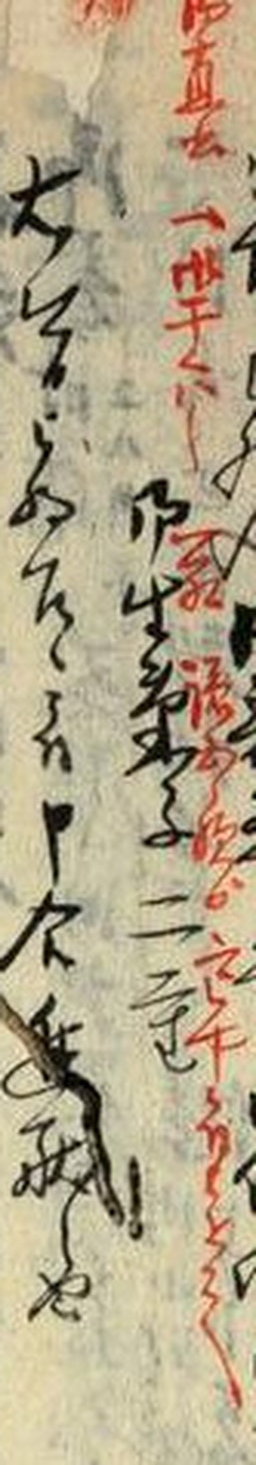右今日被為召候ニ付申合進献之由
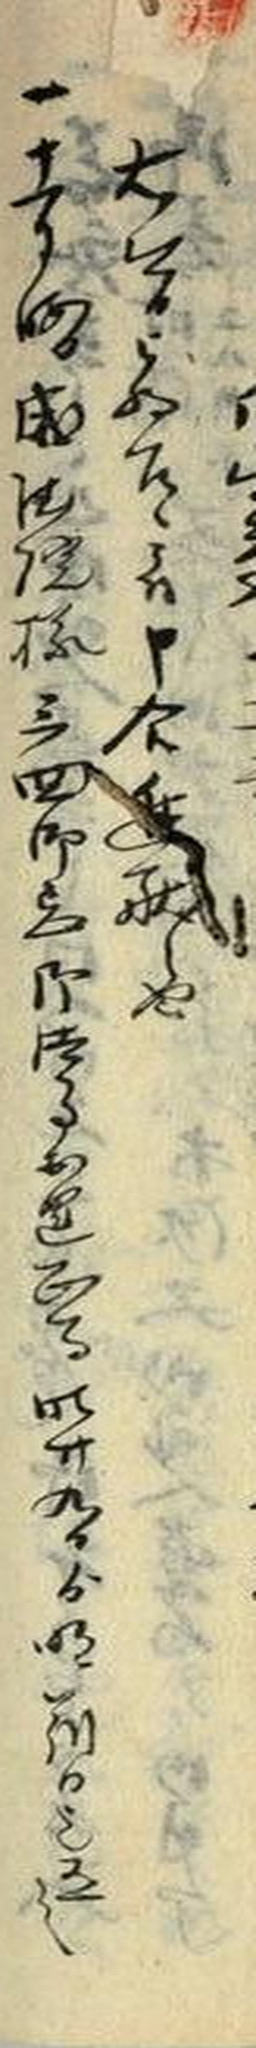一十一月晦日威徳院様三回御忌御法事於運正寺昨廿九日ゟ明朔日迄有之
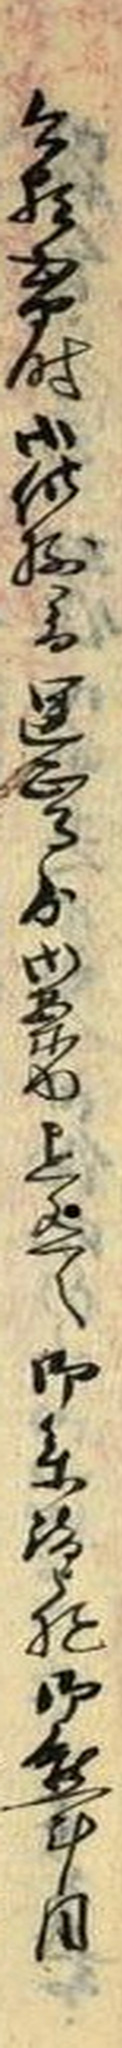今朝五半時御供揃ニ而運正寺ゟ御案内申上有之御参詣被遊御熨斗目
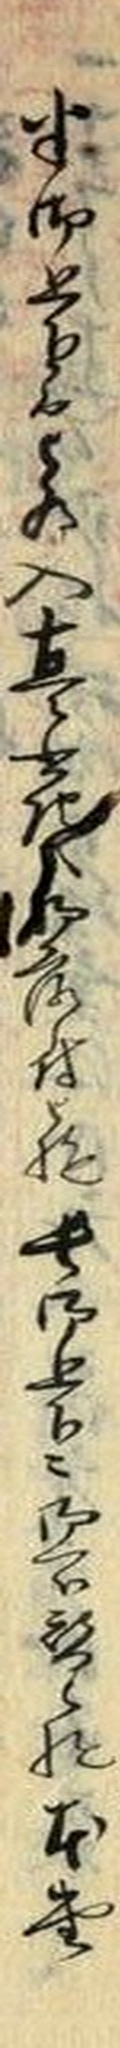半御上下ニ而被為入直ニ書院へ御落付被遊長御上下ニ御召替被遊本堂
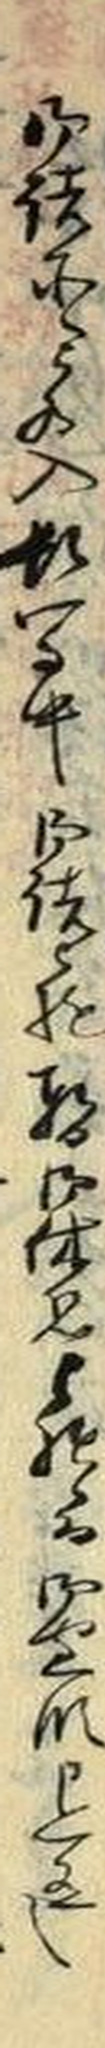御詰所へ被為入影写中御詰被遊暫御休息被遊候而御宜段申上有之
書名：少傅日録抄（斉承付側向頭取日記、在国）
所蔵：福井県文書館 Fukui Prefectural Archives
